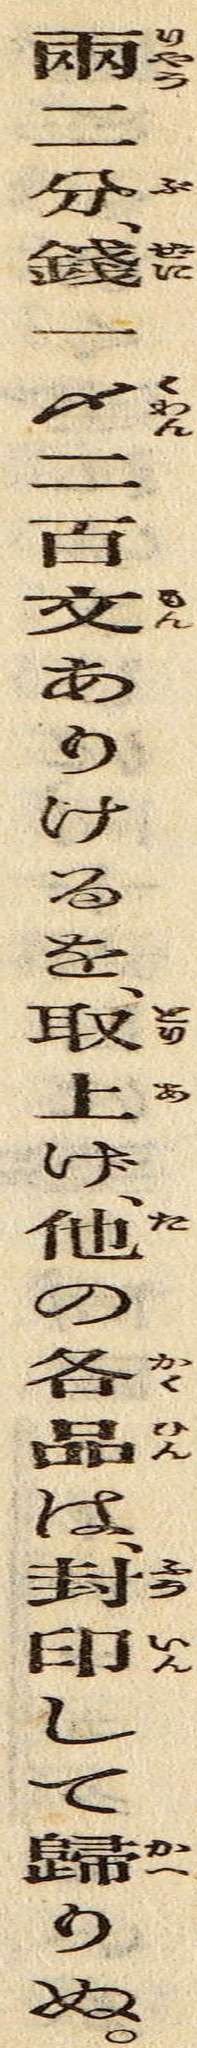両二分、銭一貫二百文ありけるを、取上げ、他の各品は、封印して帰りぬ。
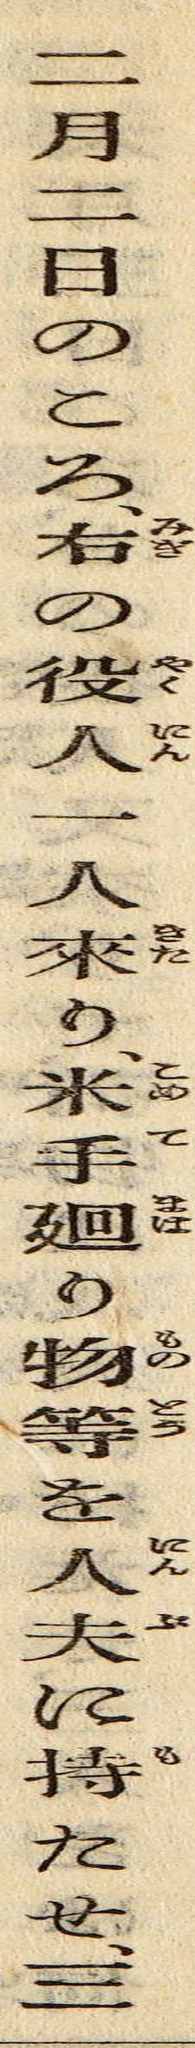二月二日のころ、右の役人一人来り、米手廻り物等を人夫に持たせ、三
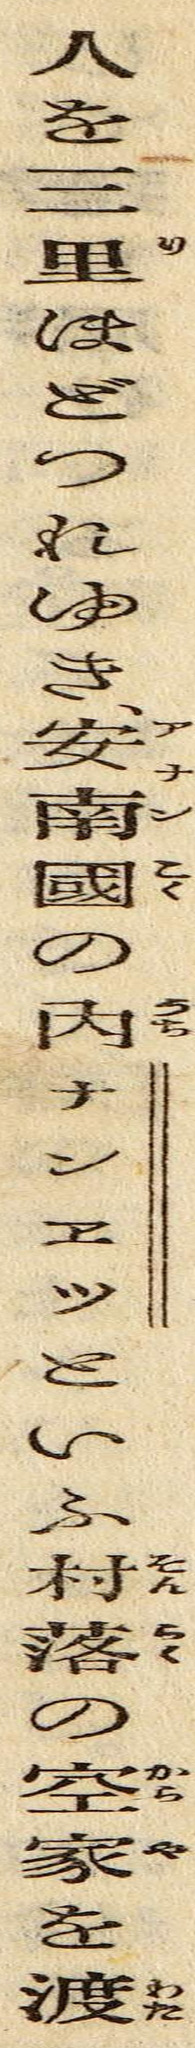人を三里ほどつれゆき、安南国の内ナンヱツといふ村落の空家を渡
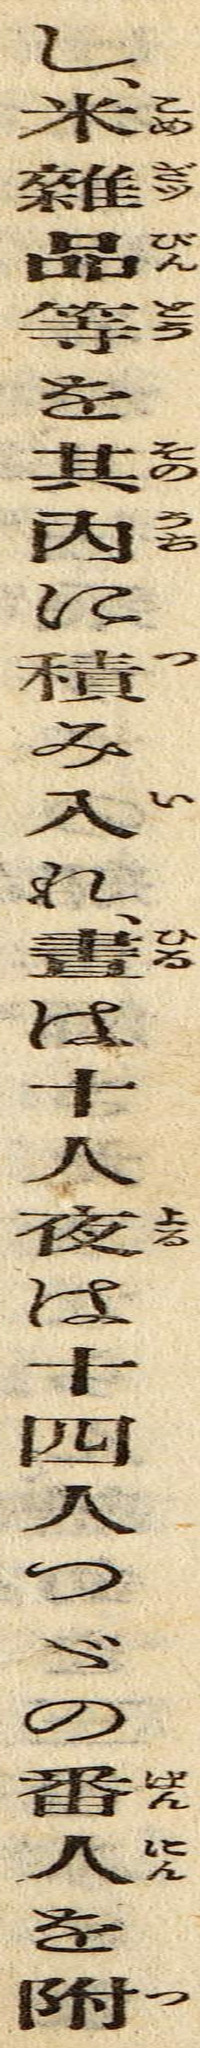し、米雑品等を其内に積み入れ、昼は十人夜は十四人つゞの番人を附

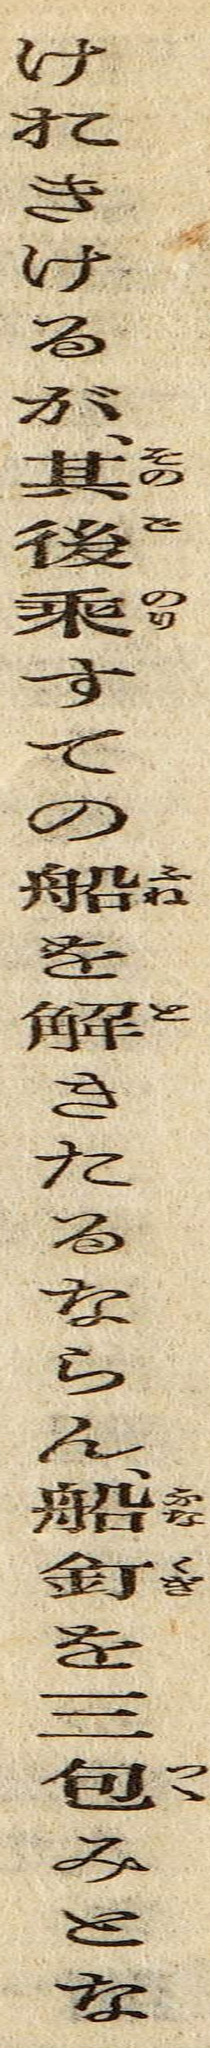けおきけるが、其後乗すての船を解きたるならん、船釘を三包みとな
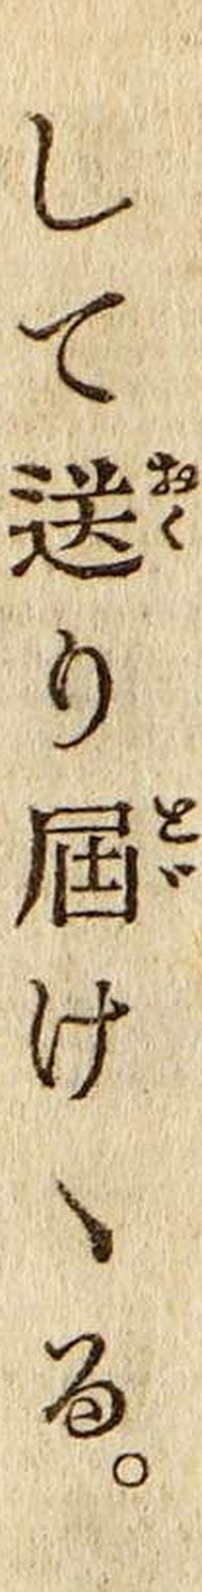して送り届けヽる。
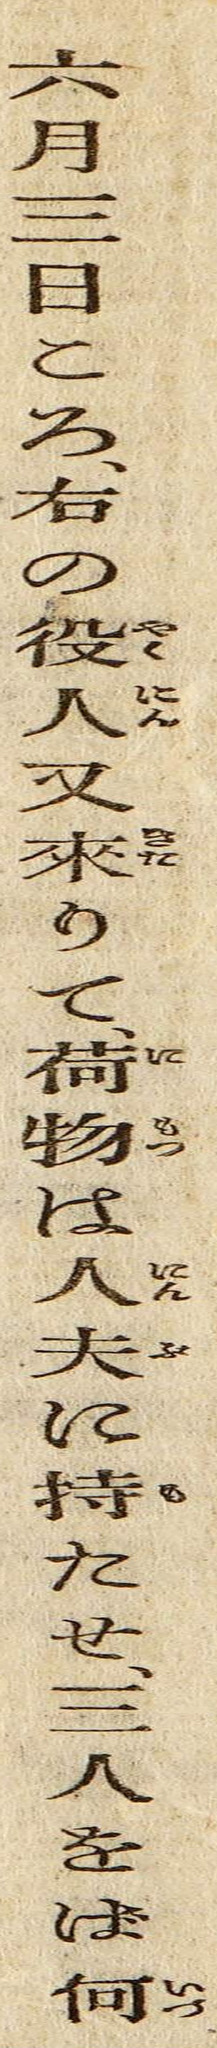六月三日ころ、右の役人又来りて、荷物は人夫に持たせ、三人をば何
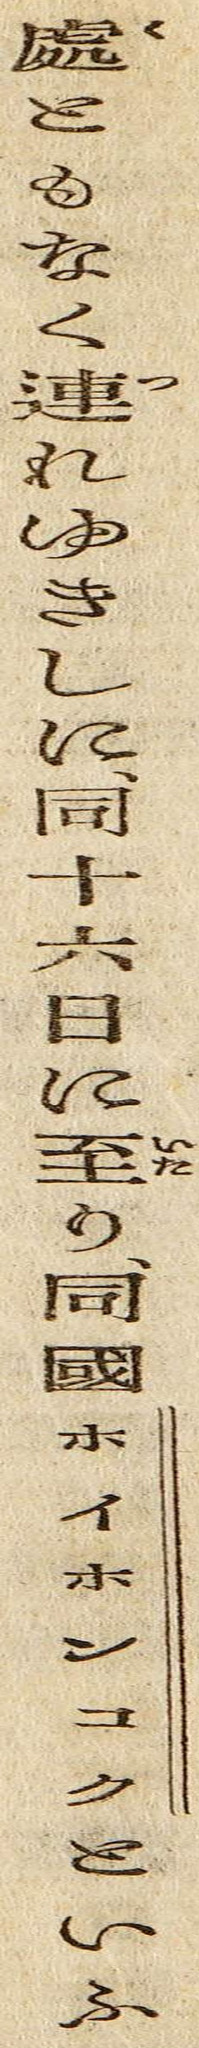処ともなく連れゆきしに、同十六日に至り、同国ホイホンコクといふ
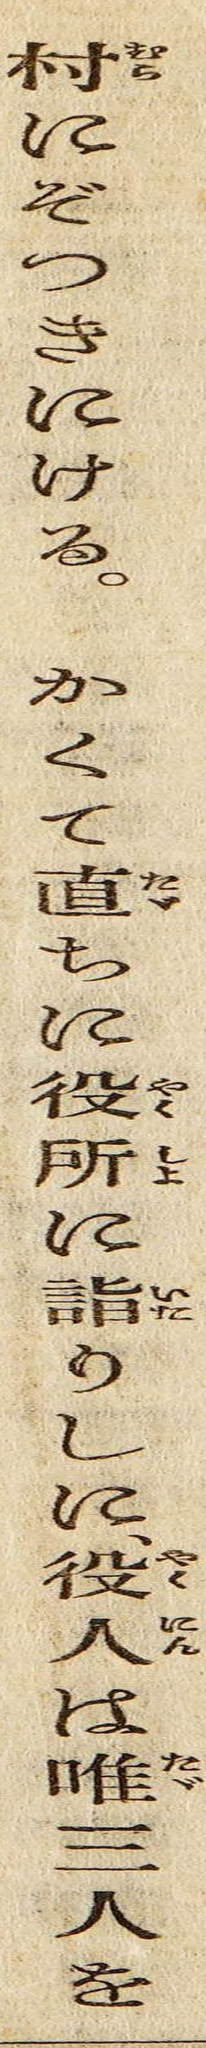村にぞつきにける。かくて直ちに役所に詣りしに、役人は唯三人を
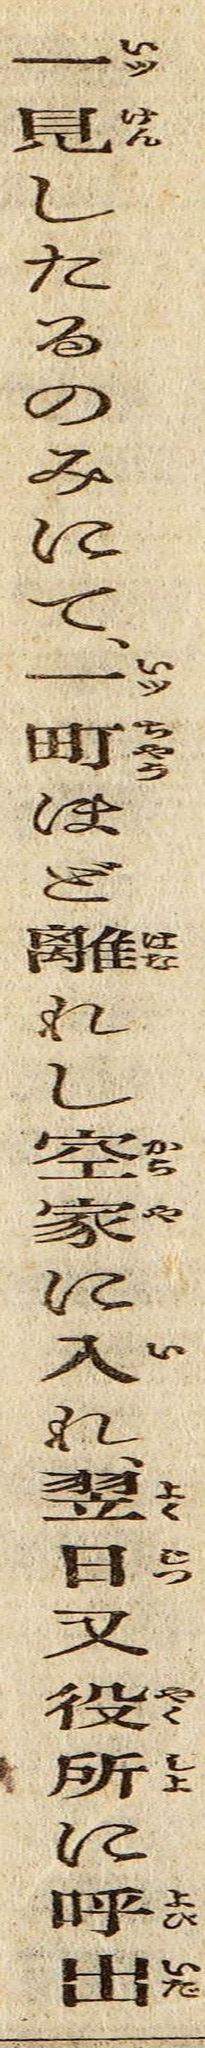一見したるのみにて、一町ほど離れし空家に入れ、翌日又役所に呼出
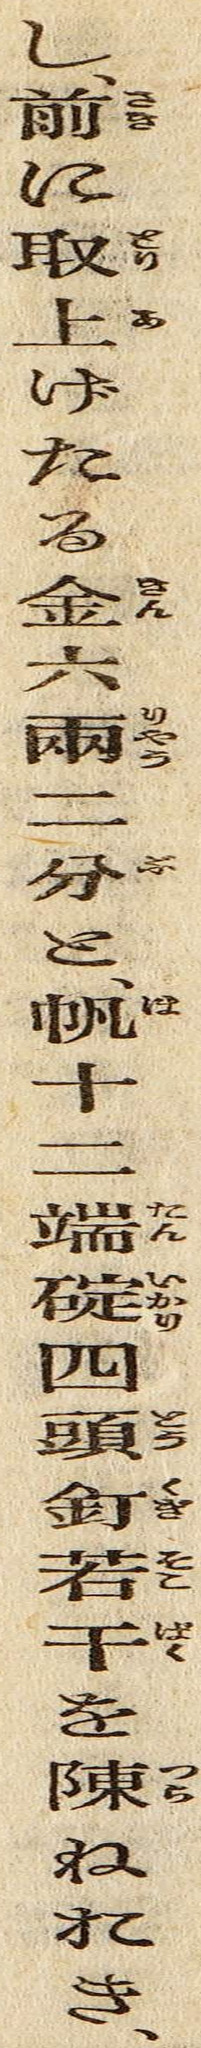し、前に取上げたる金六両二分と、帆十二端碇四頭釘若干を陳ねおき、
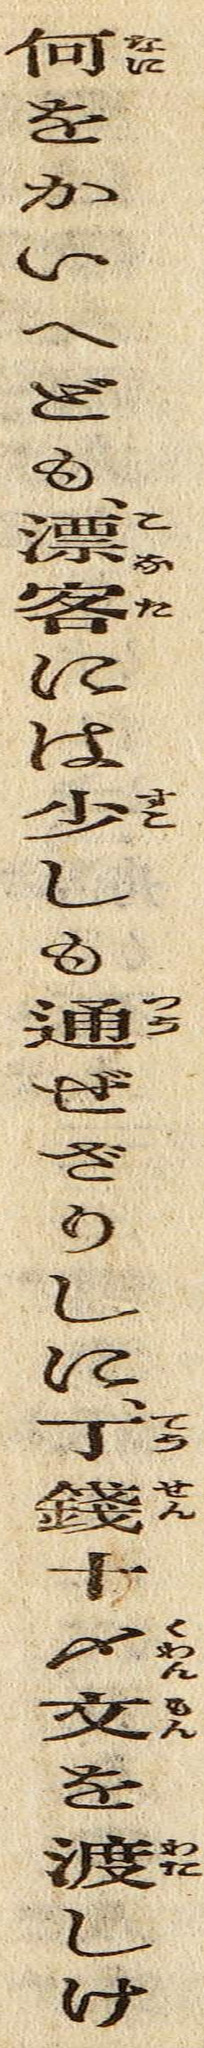何をかいへども、漂客には少しも通ぜざりしに、丁銭十貫文を渡しけ
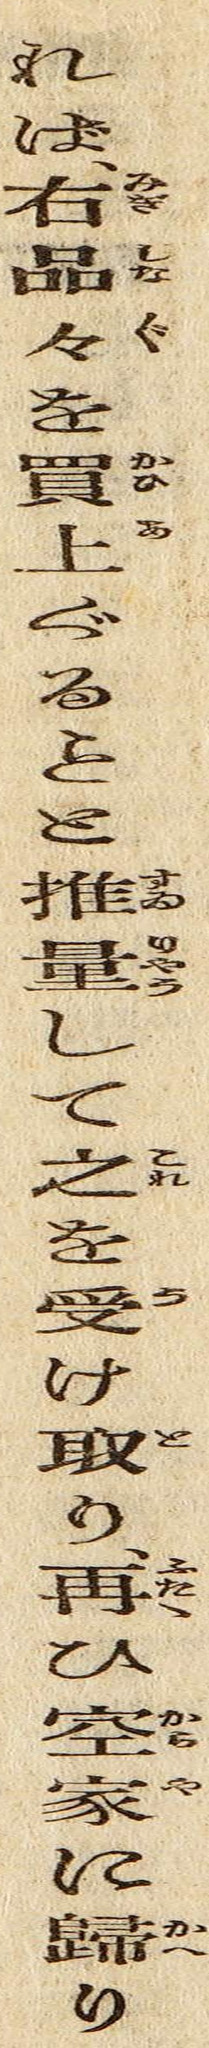れば、右品々を買上ぐることと推量して之を受け取り、再ひ空家に帰り
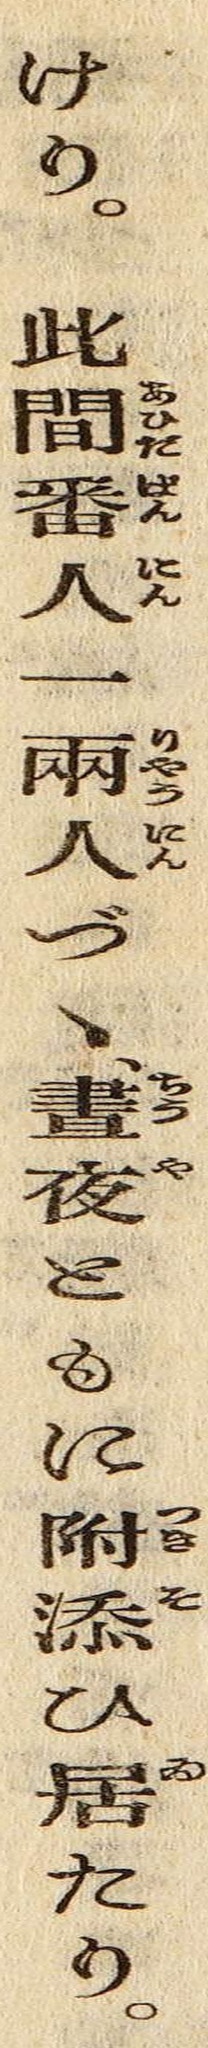けり。此間番人一両人づヽ、昼夜ともに附添ひ居たり。
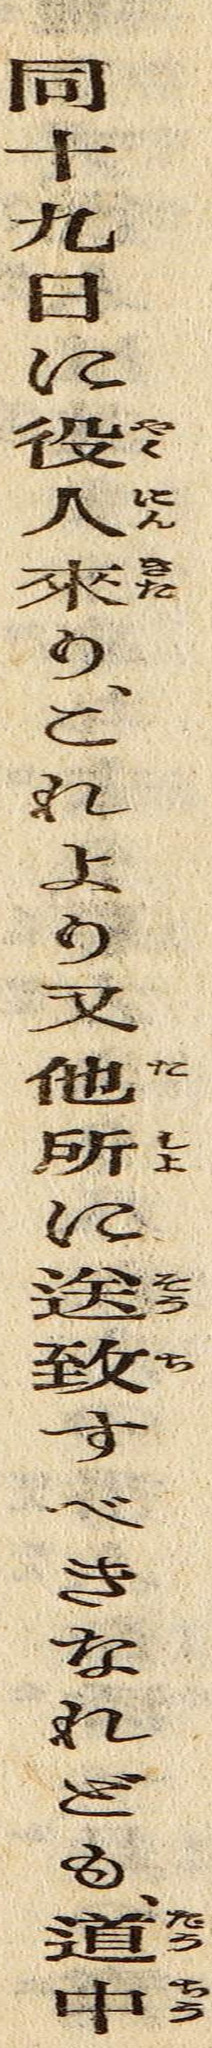同十九日に役人来り、これより又他所に送致すべきなれども、道中
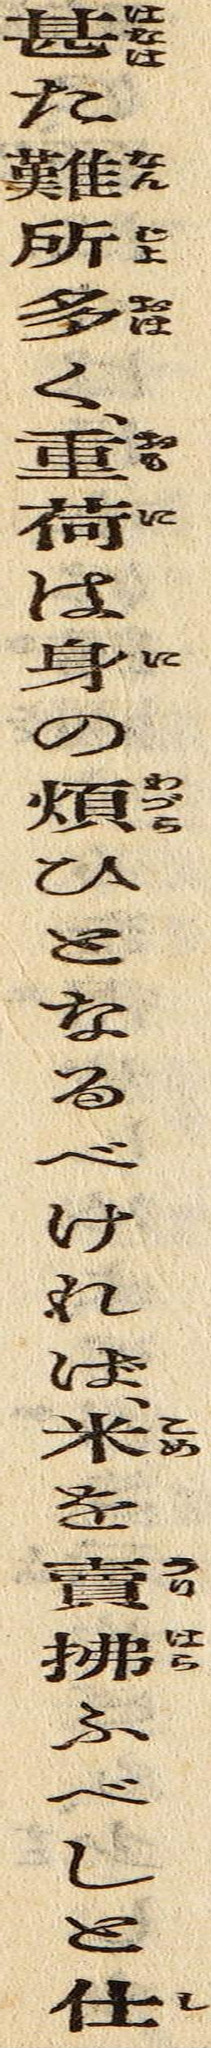甚た難所多く、重荷は身にの煩ひとなるべければ、米を売払ふべしと仕
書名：日本漂流譚
